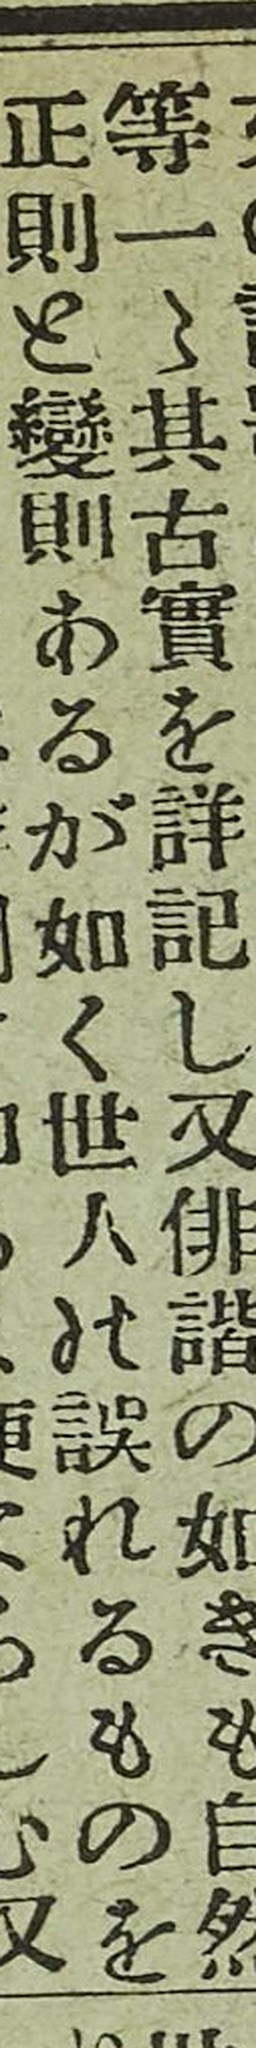正則と変則あるが如く世人の誤れるものを
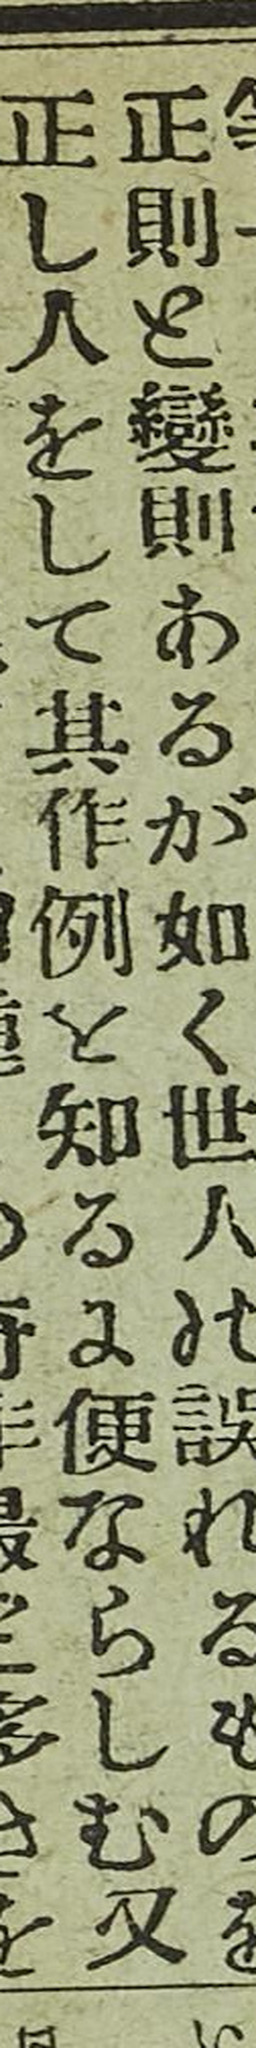正し人をして其作例を知るに便ならしむ又
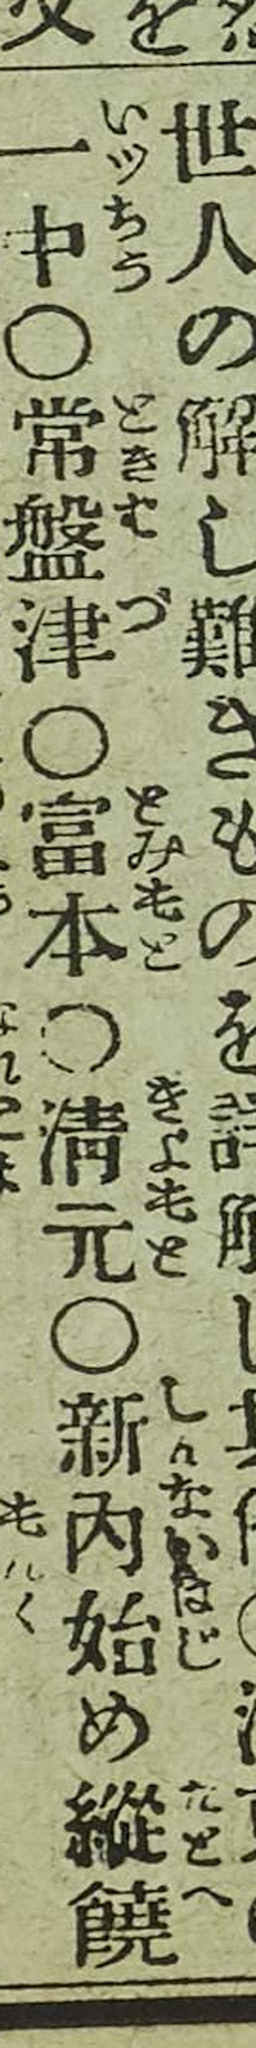一中○常磐津○富本○清元○新内始め縦饒
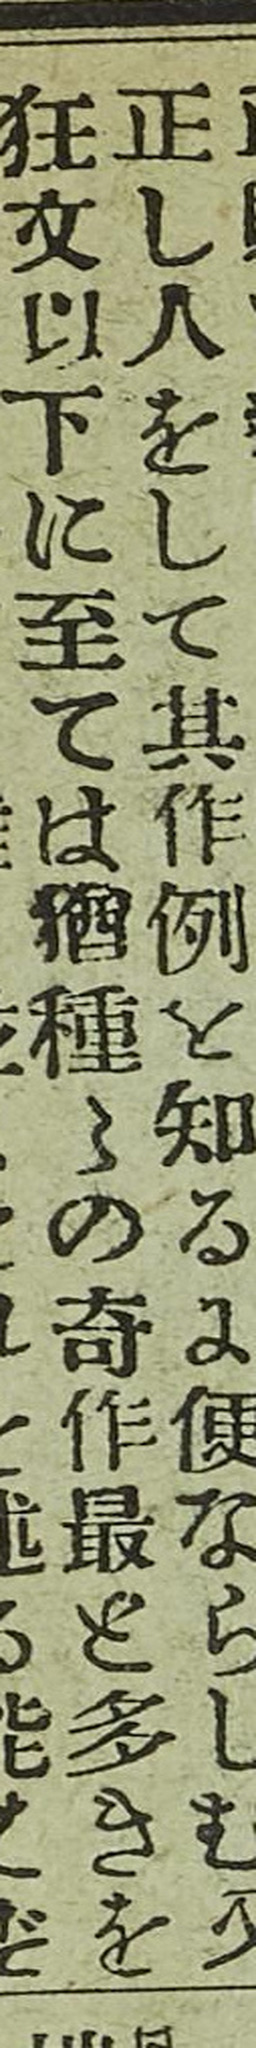狂文以下に至ては猶種〻の奇作最と多きを
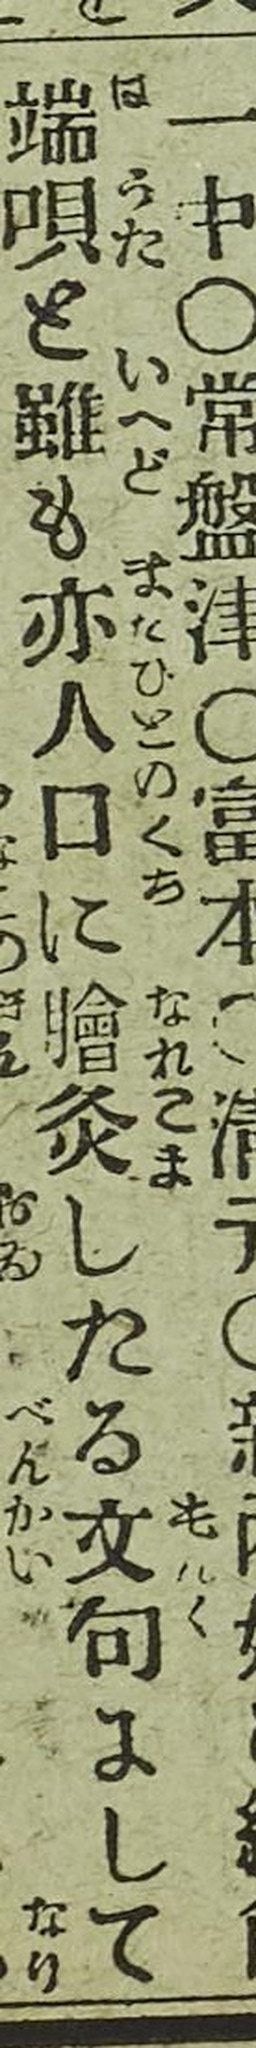端唄と雖も亦人口に膾灸したる文句にして
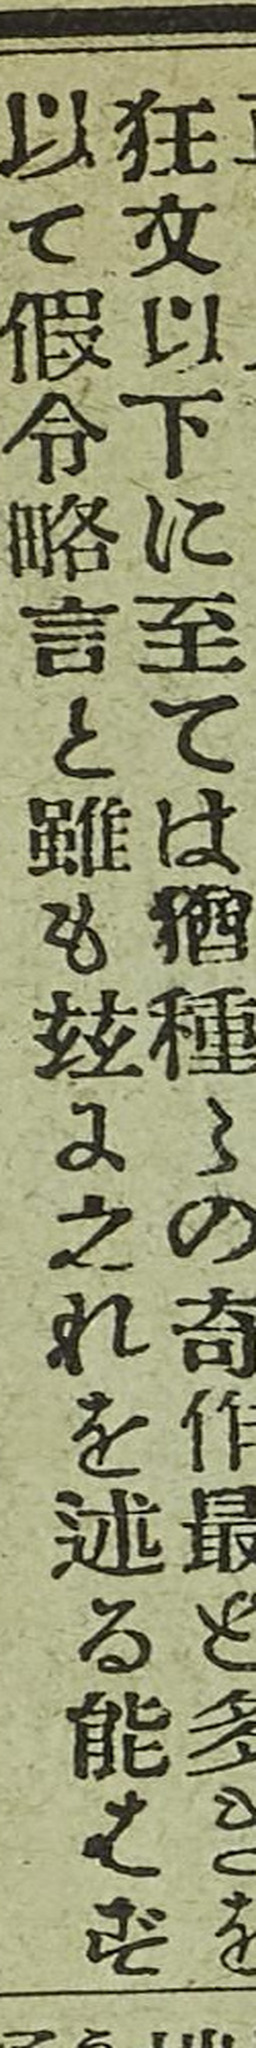以て仮令略言と雖も茲に之れを述る能はず
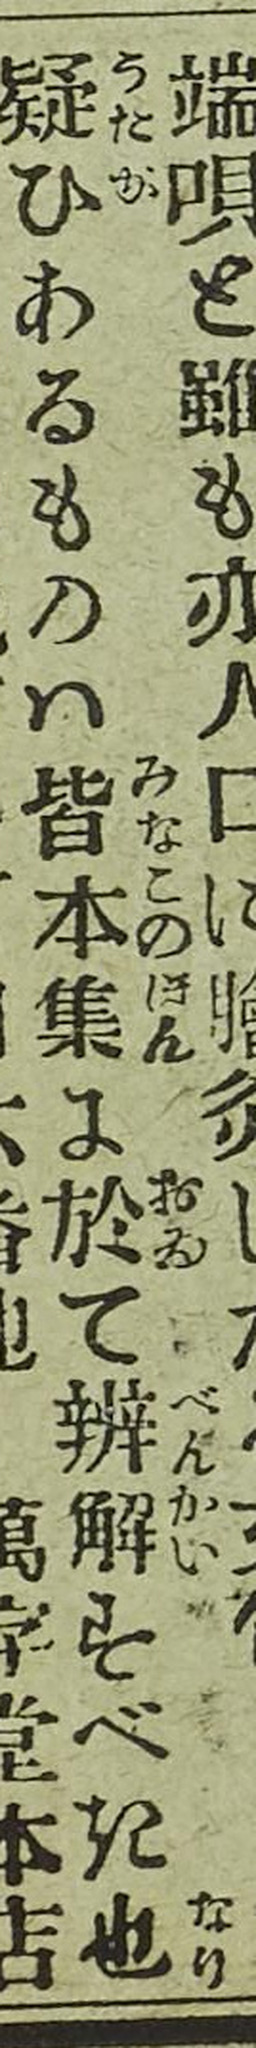疑ひあるものは皆本集に於て弁解すべき也
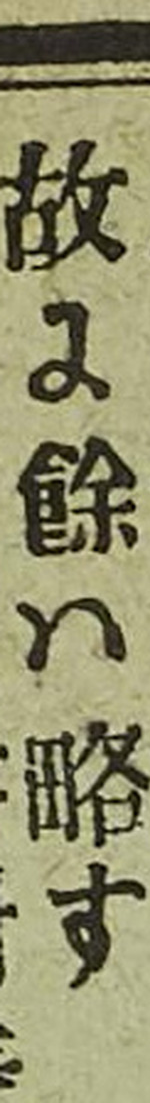故に余は略す
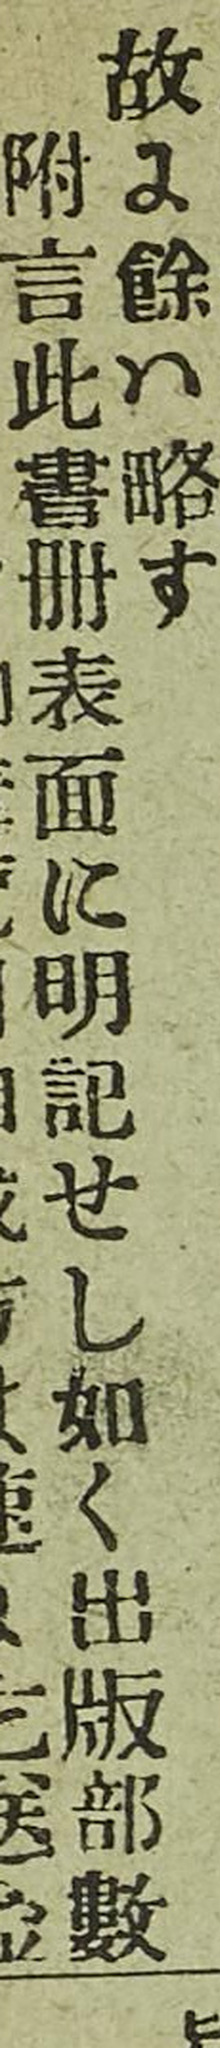附言此書冊表面に明記せし如く出版部数
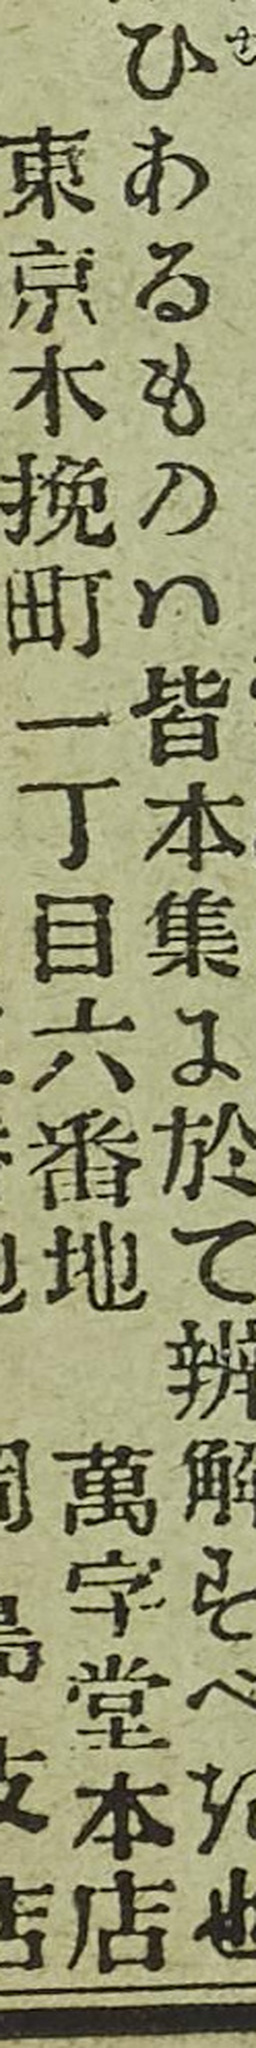東京木挽町一丁目六番地萬字堂本店
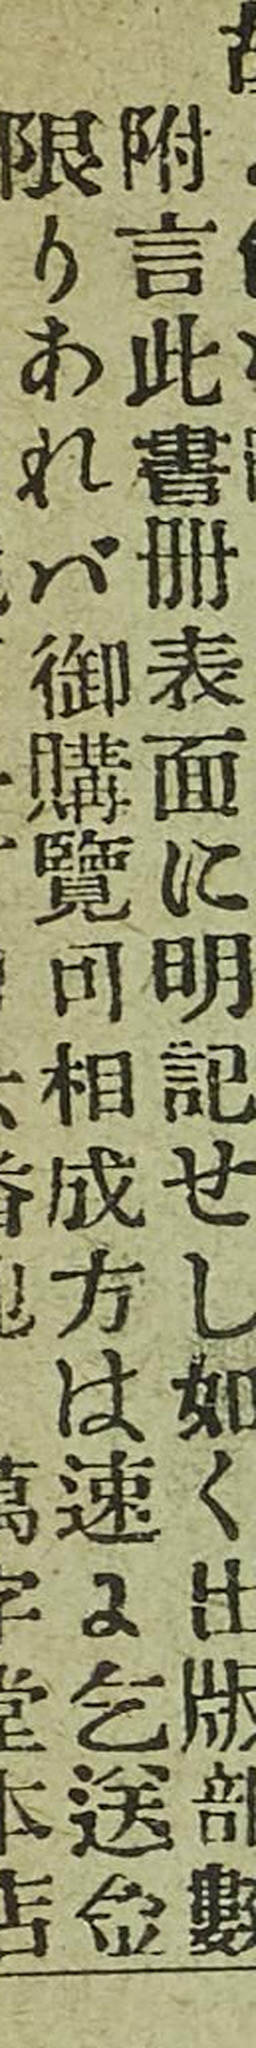限りあれば御購覧可相成方は速に乞送金
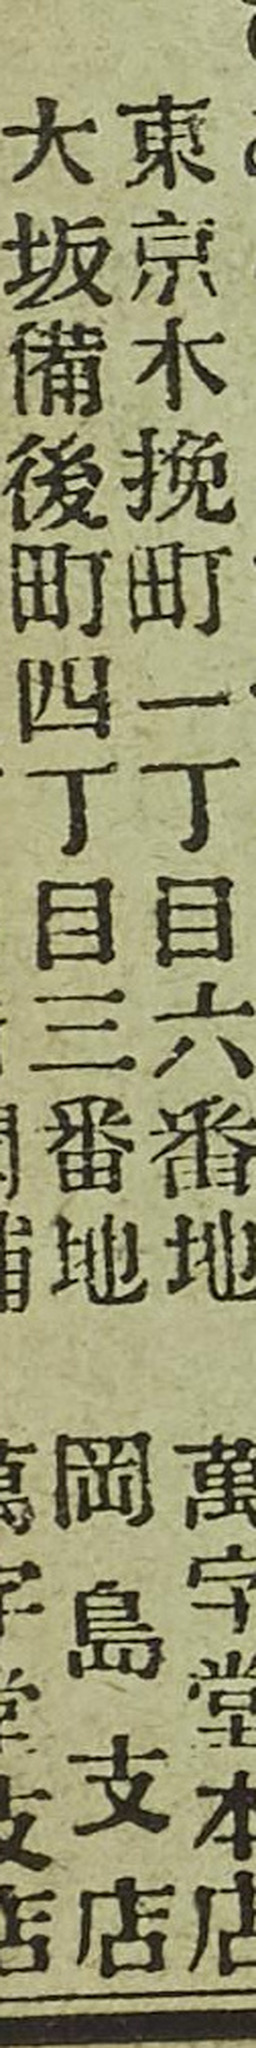大坂備後町四丁目三番地岡嶋支店
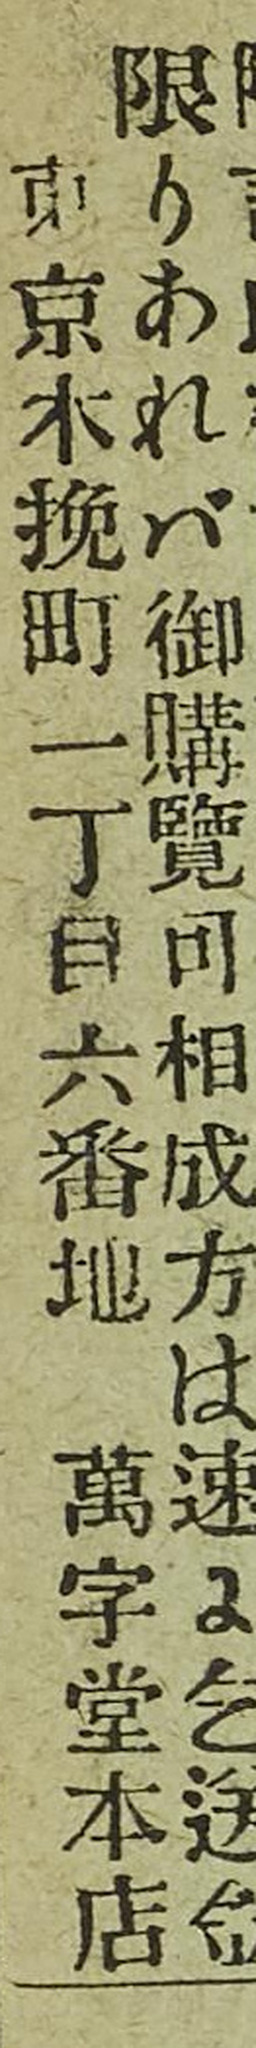東京木挽町一丁目六番地萬字堂本店
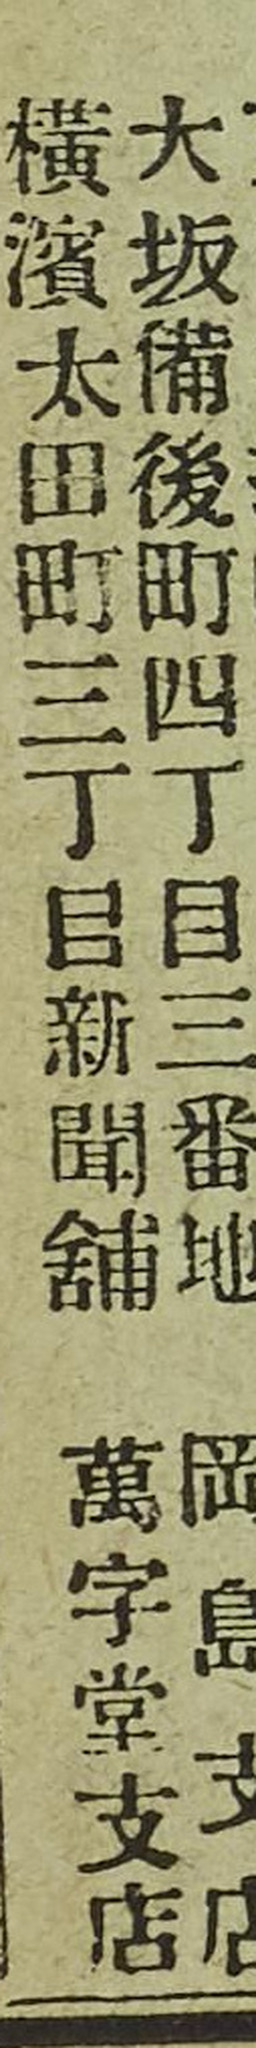横浜太田町三丁目新聞舗萬字堂支店

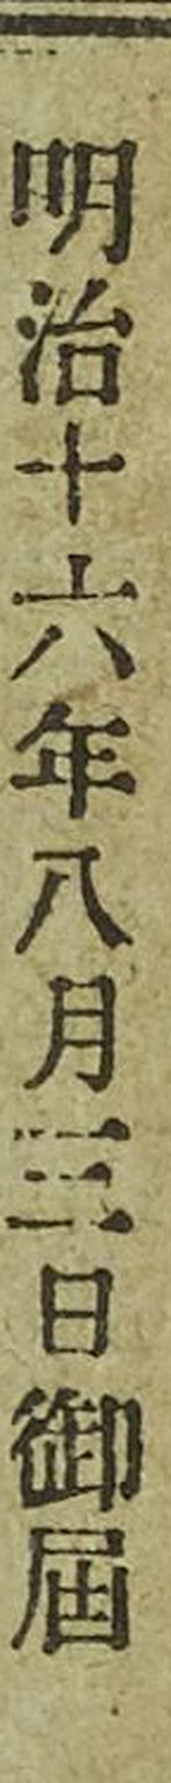明治十六年八月三日御届
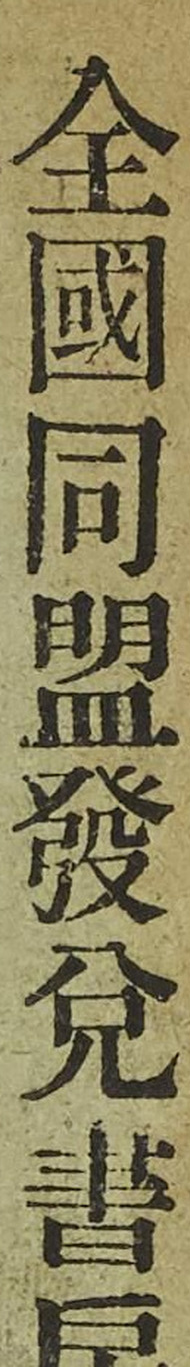全国同盟発兌書房
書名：永代惨話　文化の夢　全
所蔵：東京大学地震研究所図書室 Earthquake Research Institute Library, The University of Tokyo, JAPAN
